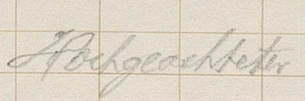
Hochgeachteter
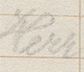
Herr
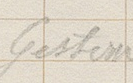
Gestern
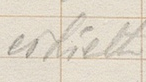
erhielt
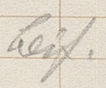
Brief
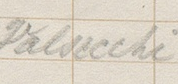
Valsecchi,
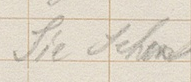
Sie sehen auf
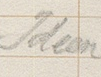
andere
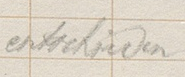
entschieden
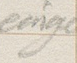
eingeht &
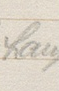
sehr
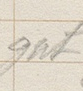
gestimt
